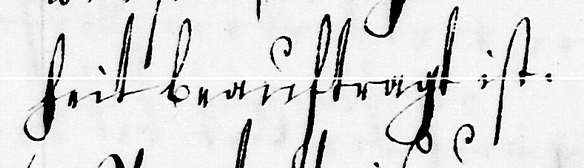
heit beauftragt ist.
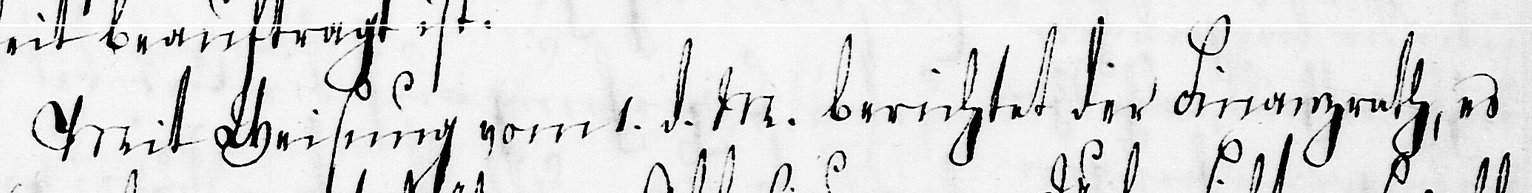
Mit Weisung vom 1. d. M. berichtet der Finanzrath, es
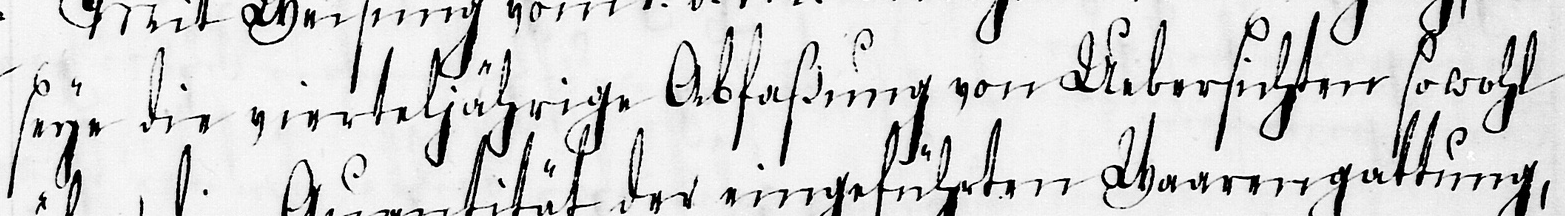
seye die vierteljährige Abfaßung von Uebersichten sowohl
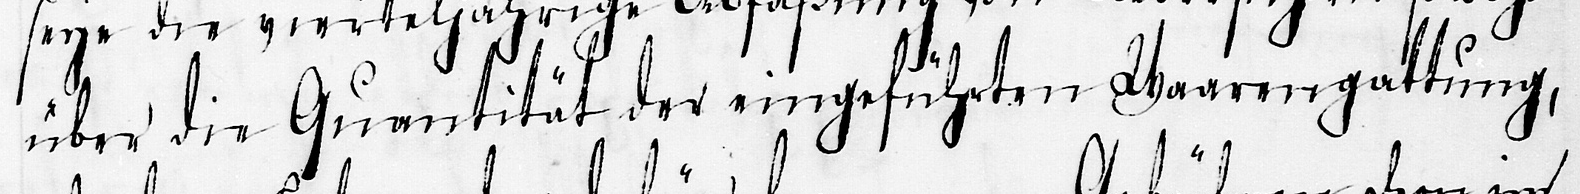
über die Quantität der eingeführten Waarengattung,
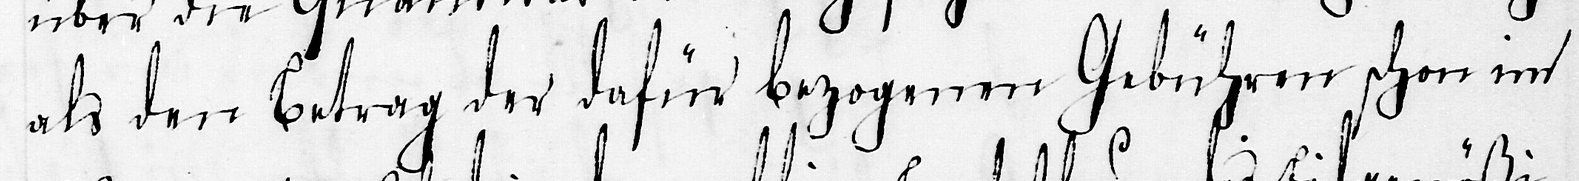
als den Betrag der dafür bezogenen Gebühren schon im
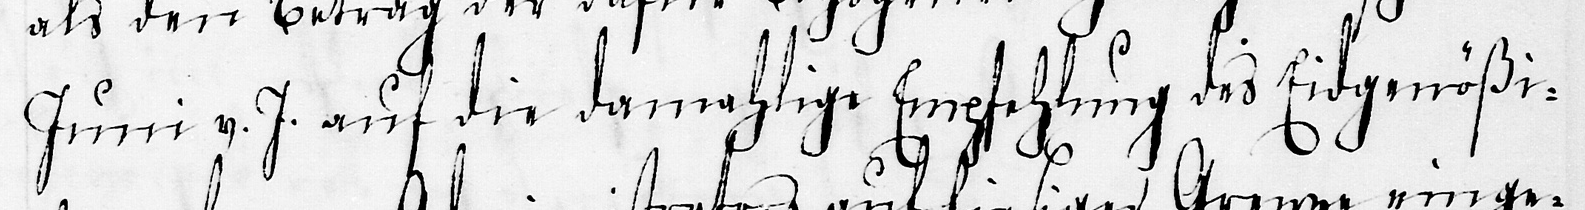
Juni v. J. auf die damahlige Empfehlung des Eidgenößi¬
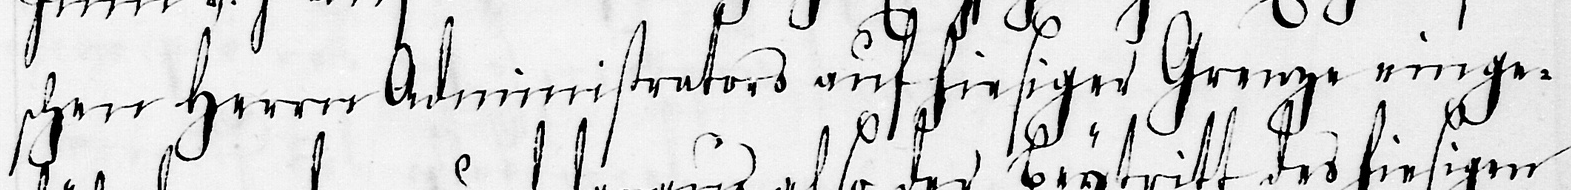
schen Herrn Administrators auf hiesiger Grenze einge¬
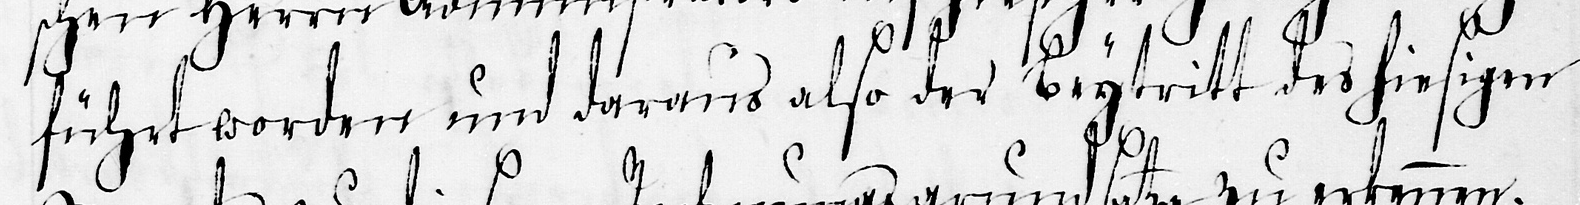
führt worden und daraus also der Beytritt des hiesigen
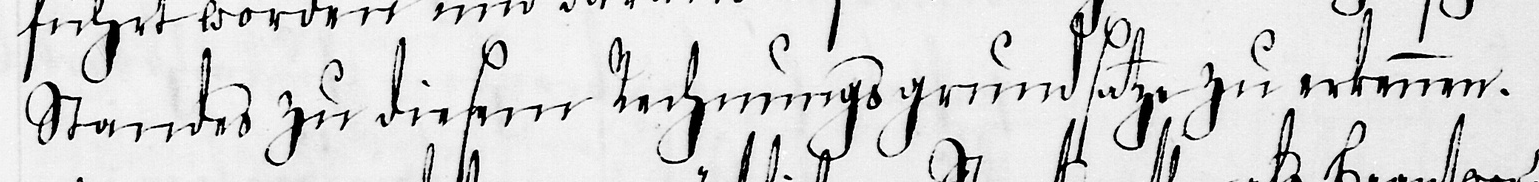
Standes zu diesem Rechnungsgrundsatze zu erkennen.
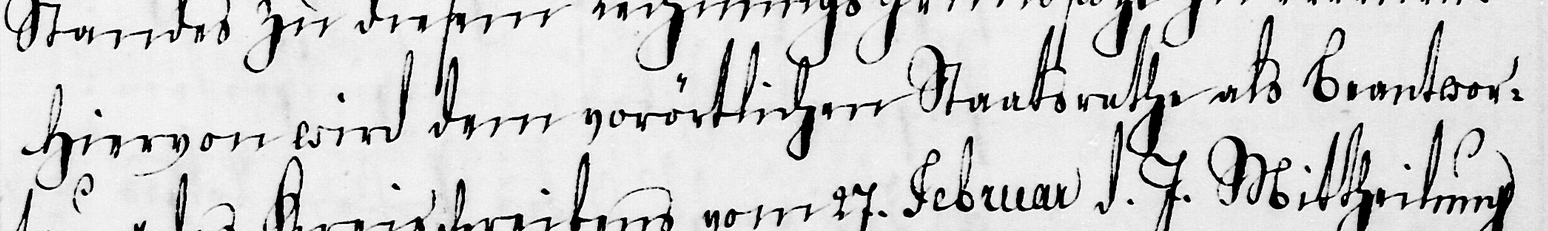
Hiervon wird dem vorörtlichen Staatsrathe als Beantwor¬
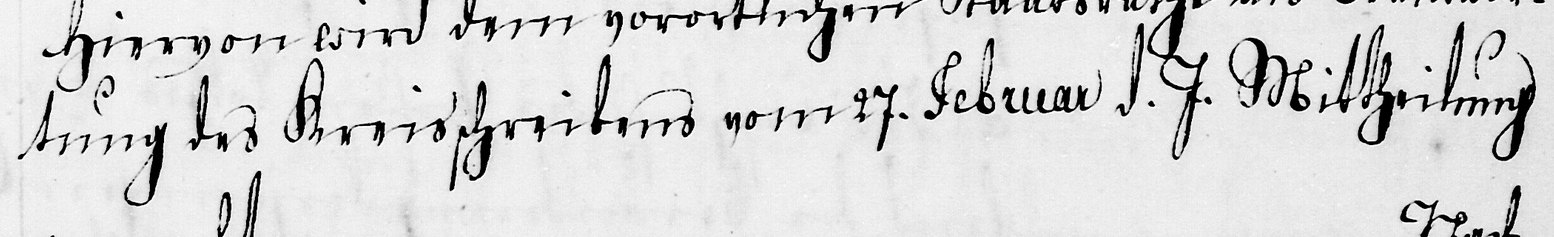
tung des Kreisschreibens vom 27. Februar d. J. Mittheilung
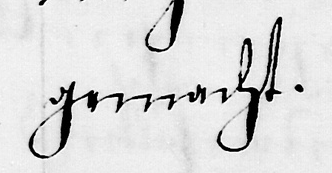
gemacht.
